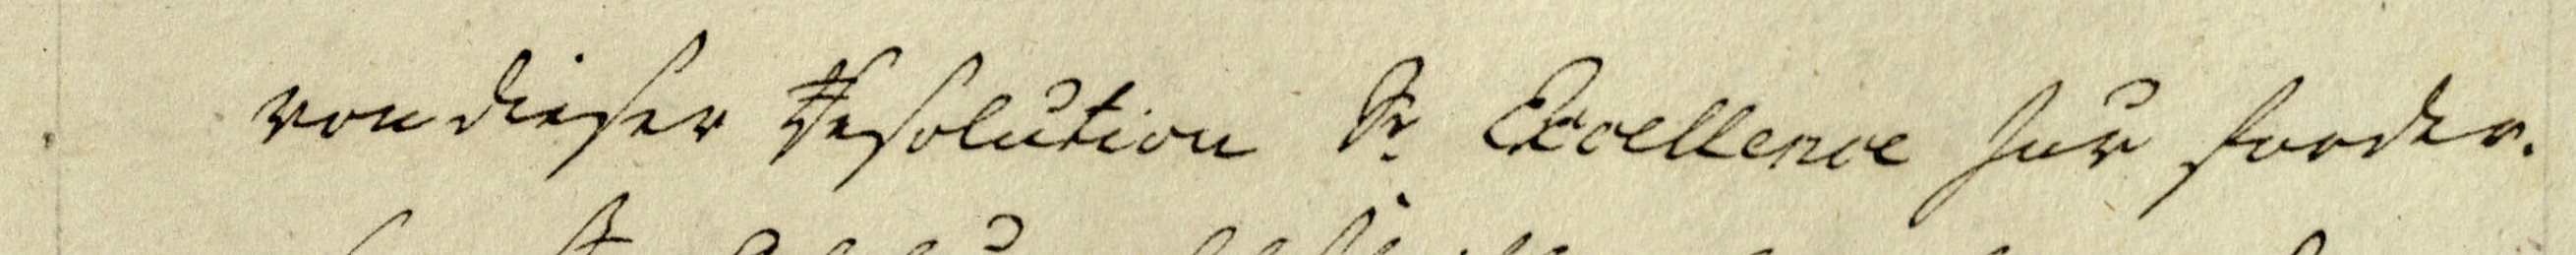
von dieser Resolution Sr Excellence zur forder¬
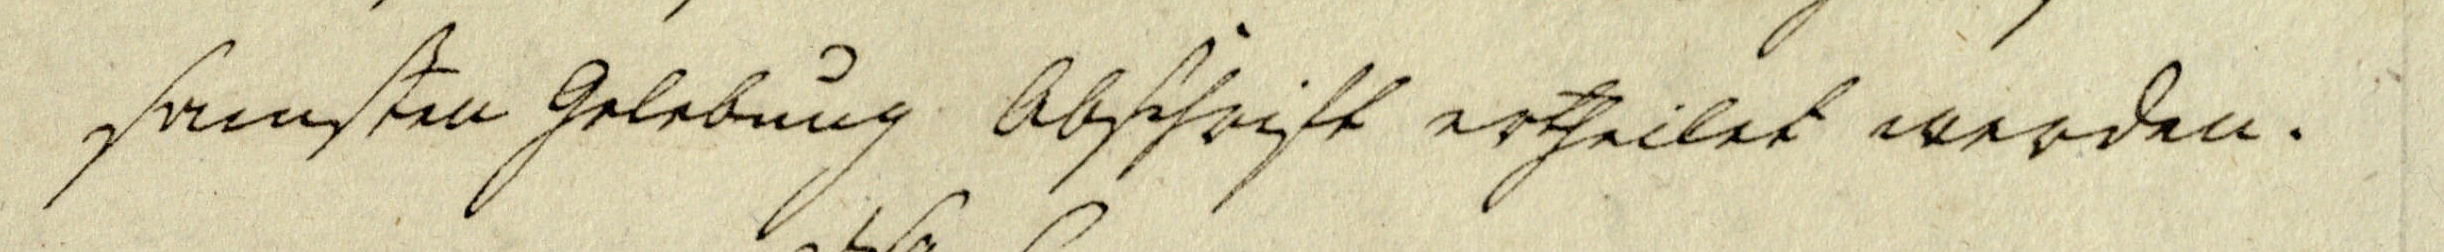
samsten Gelebung Abschrift ertheilet werden.
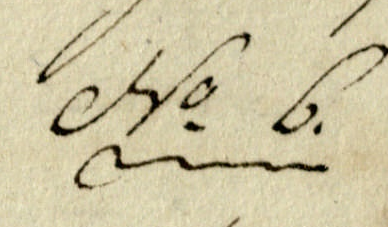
No 6.
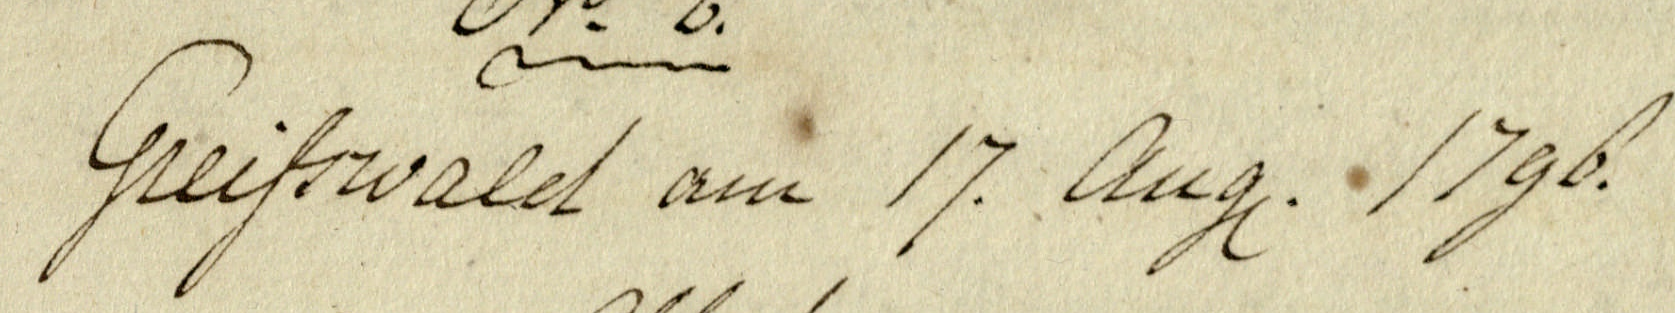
Greifswald am 17. Aug. 1796.
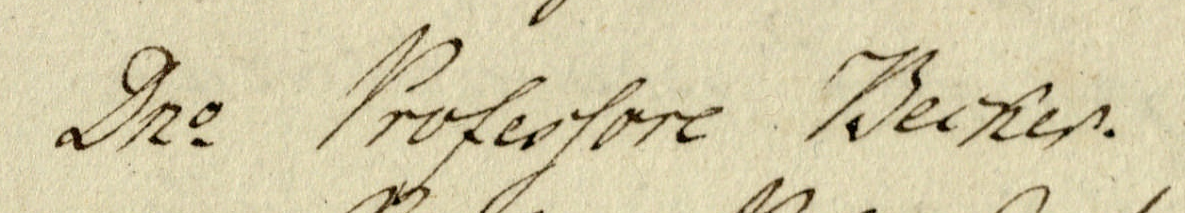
Dn Professor Becker.
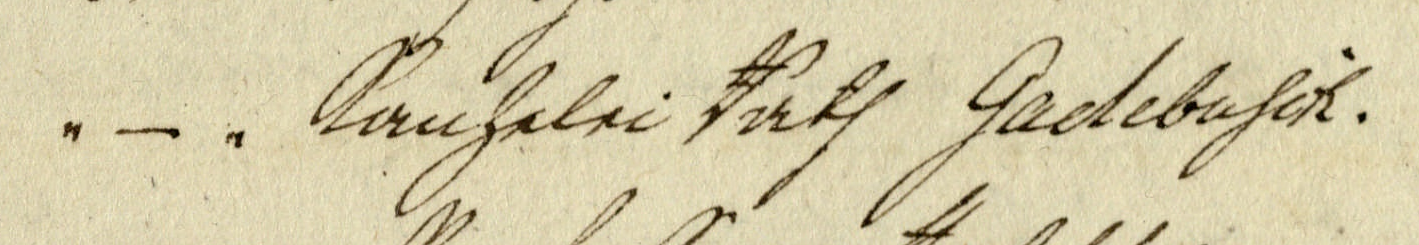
Kanzelei Rath Gadebusch.
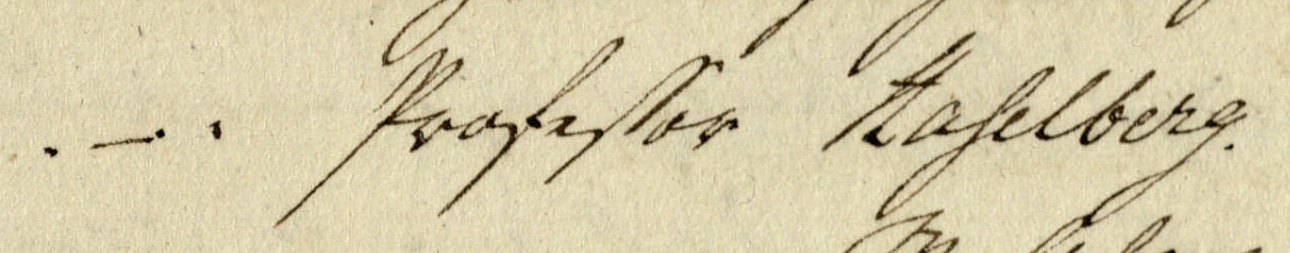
Professor Haselberg.
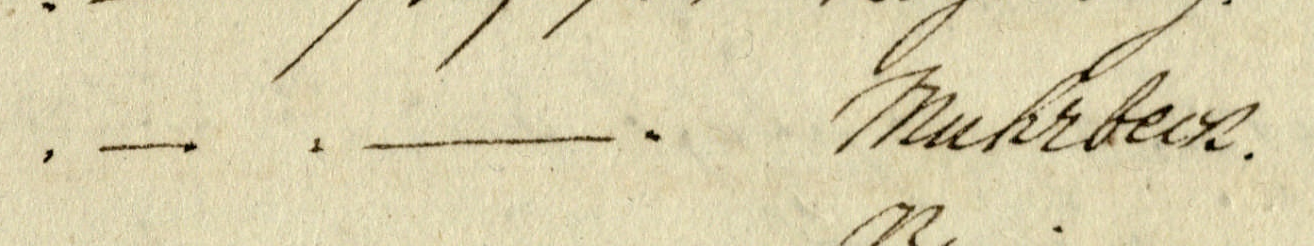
Muhrbeck.
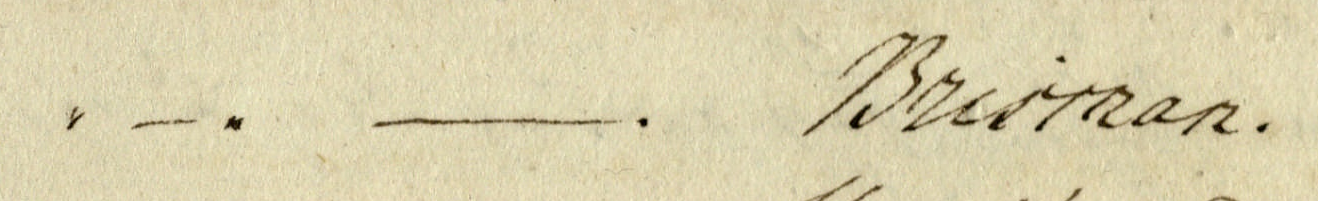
Brisman.
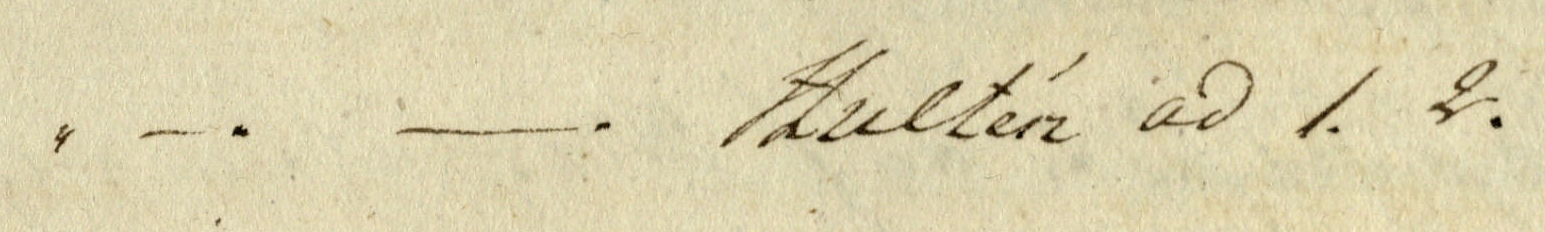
Hultén ad 1. 2.
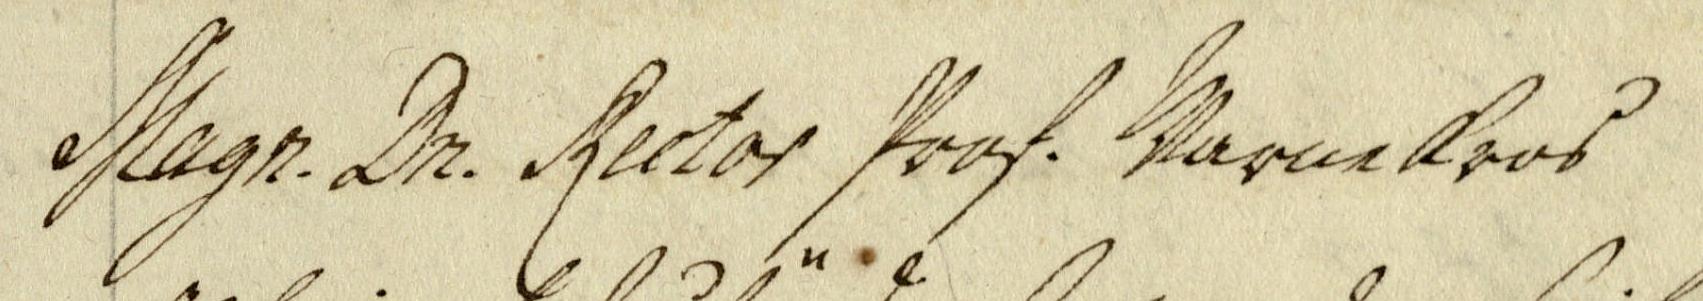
Mag. Dn. Rector Prof. Warnekros
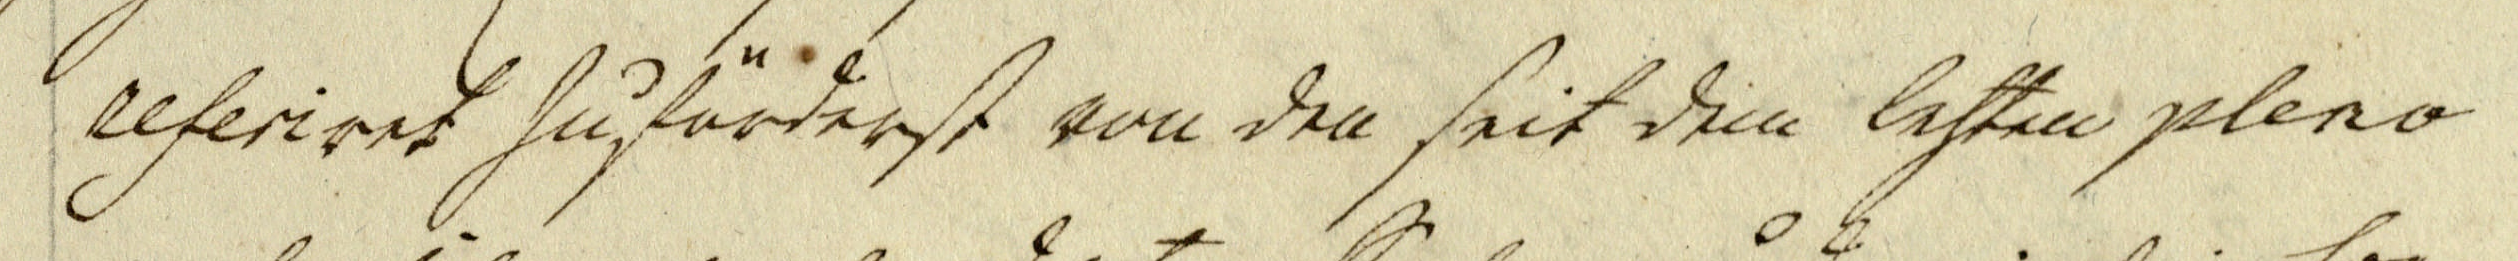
referiret zuförderst von den seit dem letzten pleno
